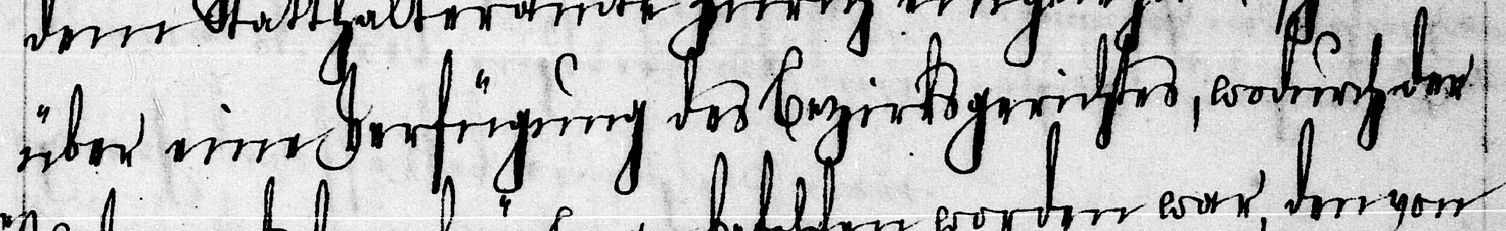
über eine Verfügung des Bezirksgerichtes, wodurch der
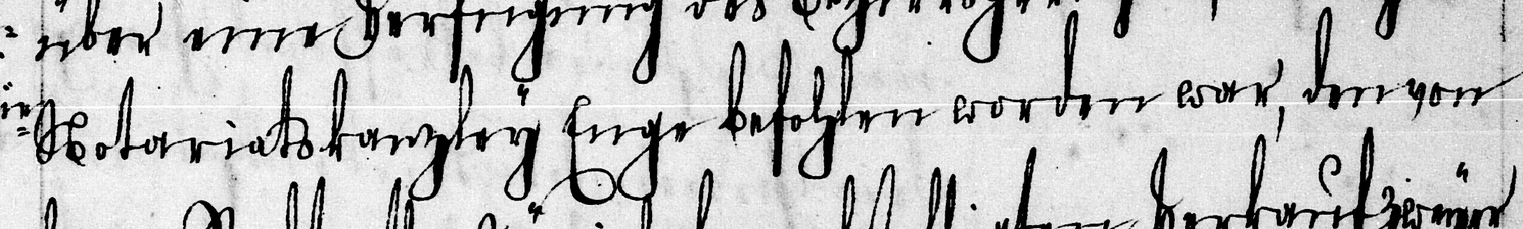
Notariatskanzley Enge befohlen worden war, den von
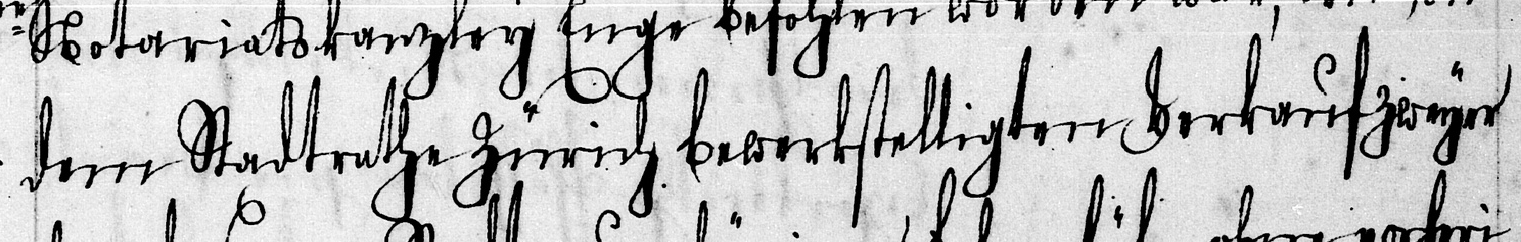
dem Stadtrathe Zürich bewerkstelligten Verkauf zweyer
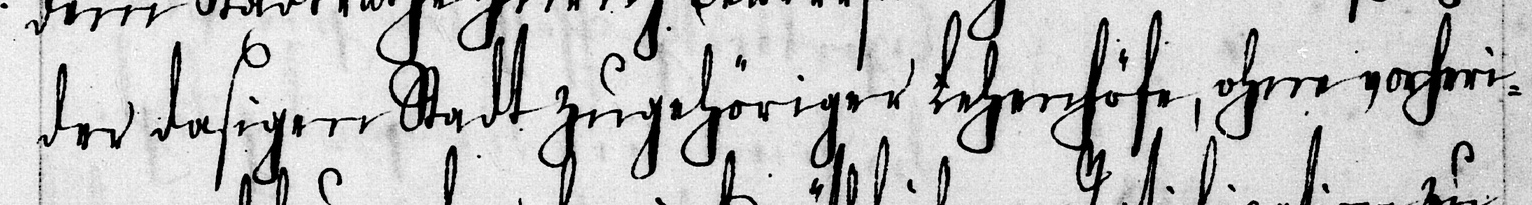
der dasigen Stadt zugehöriger Lehenhöfe, ohne vorher¬
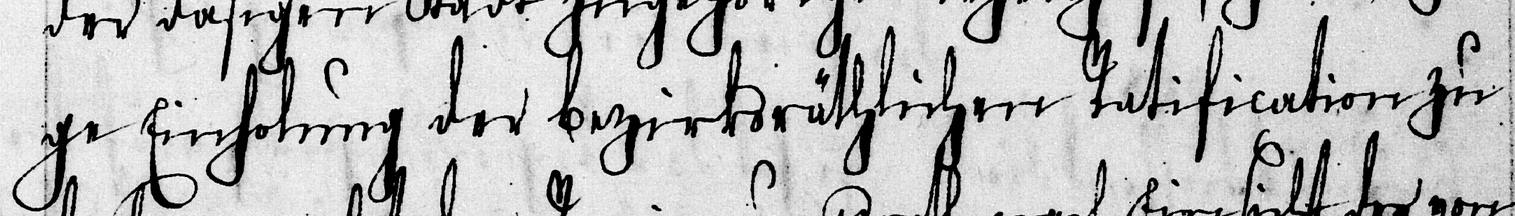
ige Einholung der bezirksräthlichen Ratification zu
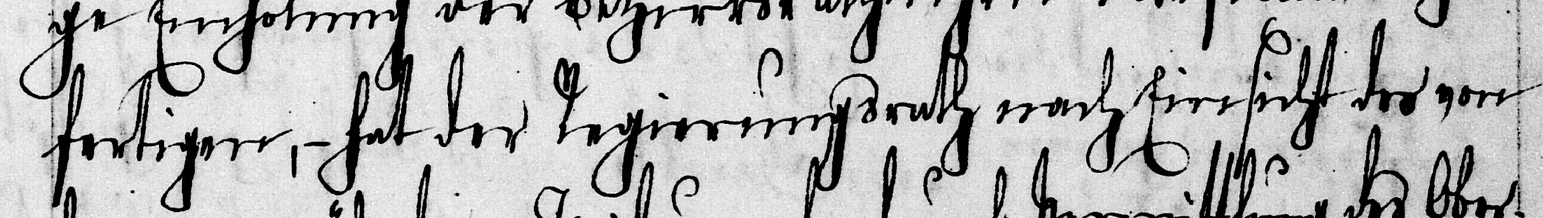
fertigen, – hat der Regierungsrath nach Einsicht der von
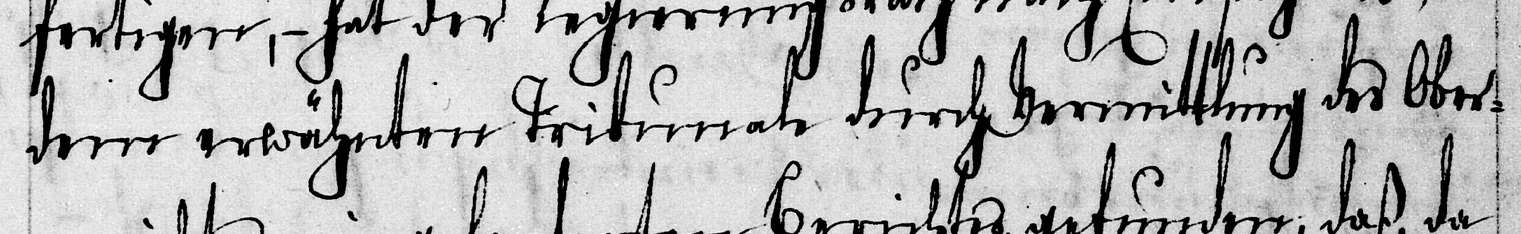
dem erwähnten Tribunale durch Vermittlung des Ober¬
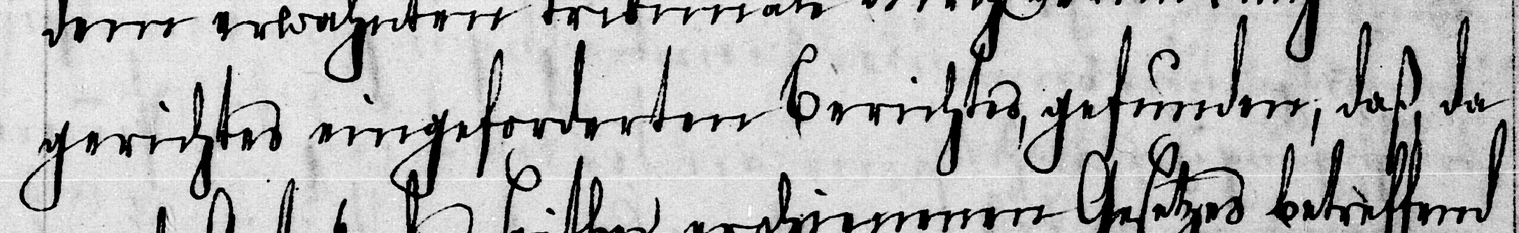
gerichtes eingeforderten Berichtes, gefunden, daß, da
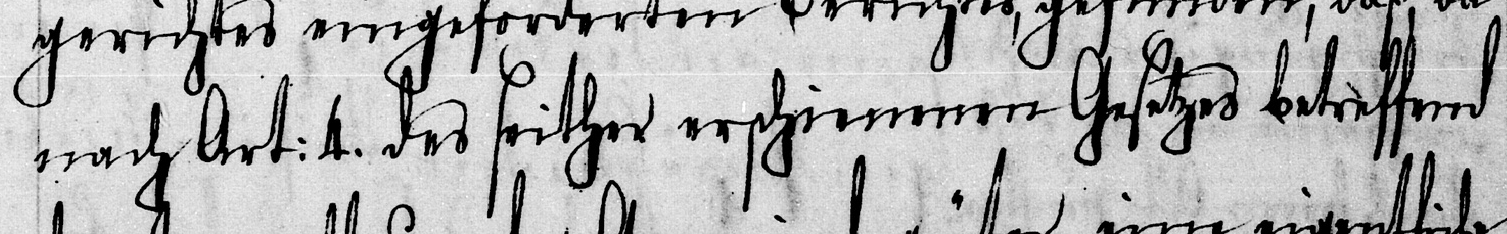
nach Art: 4. des seither erschienenen Gesetzes betreffend
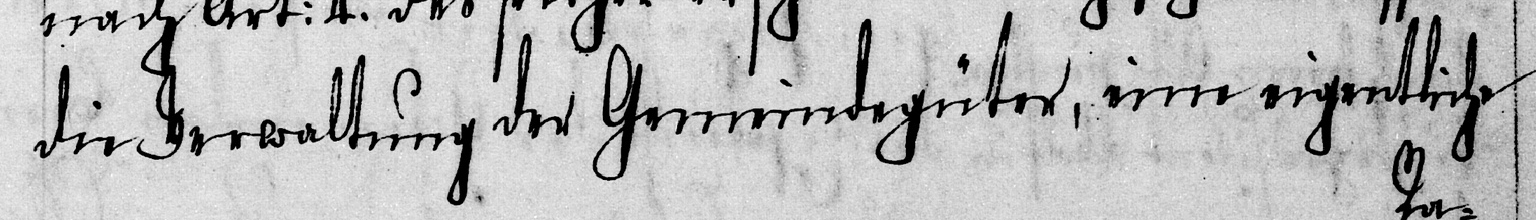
die Verwaltung der Gemeindegüter, eine eigentliche
